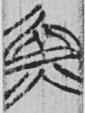魚
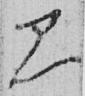已（起）
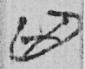凶
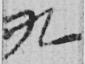九
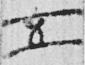五
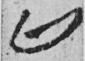㠯（以）
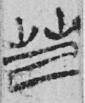芑
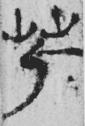苽（瓜）
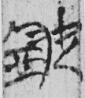○（含）
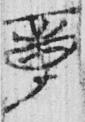章
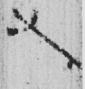又（有）
